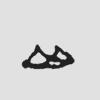凶
